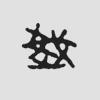{爻戈止}
